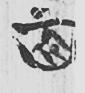百
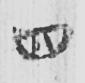四
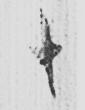十
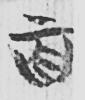百
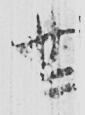廿=
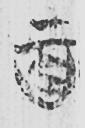百
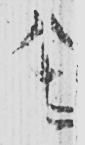八十=
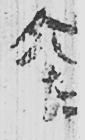六十=
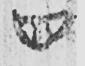四
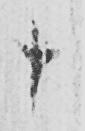十
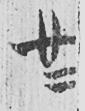廿=
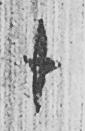十
